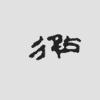進
